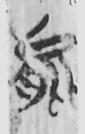能
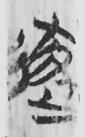逐
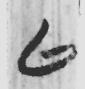㠯（以）
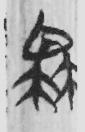𠍳
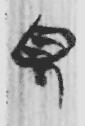見
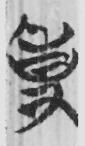事
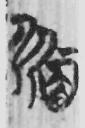弼
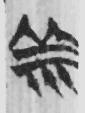羕
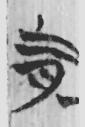{月延}
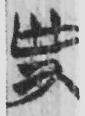拃（作）
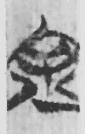余
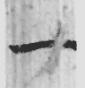一
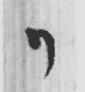人
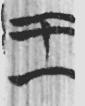王
